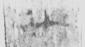廿
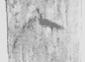六
